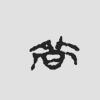尙
